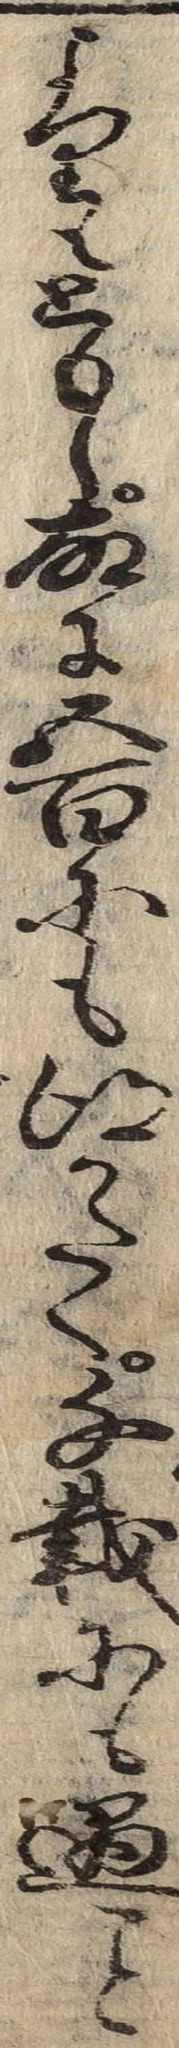よりもともし。故に五百にも得かたく。千載にも遇こと
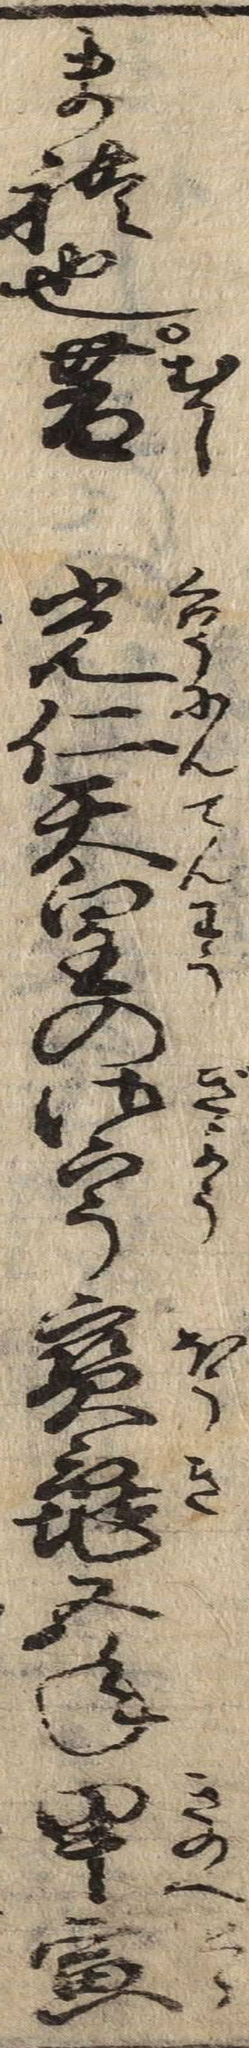まれ也。昔光仁天皇の御宇宝亀五年甲寅
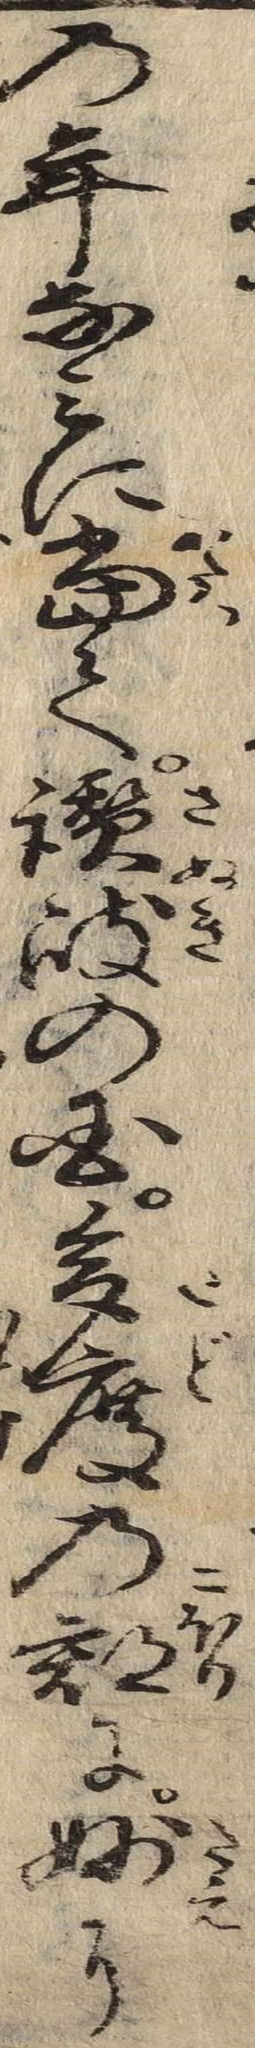の年なみに当て。讃岐の国。多度の郡に。妙に
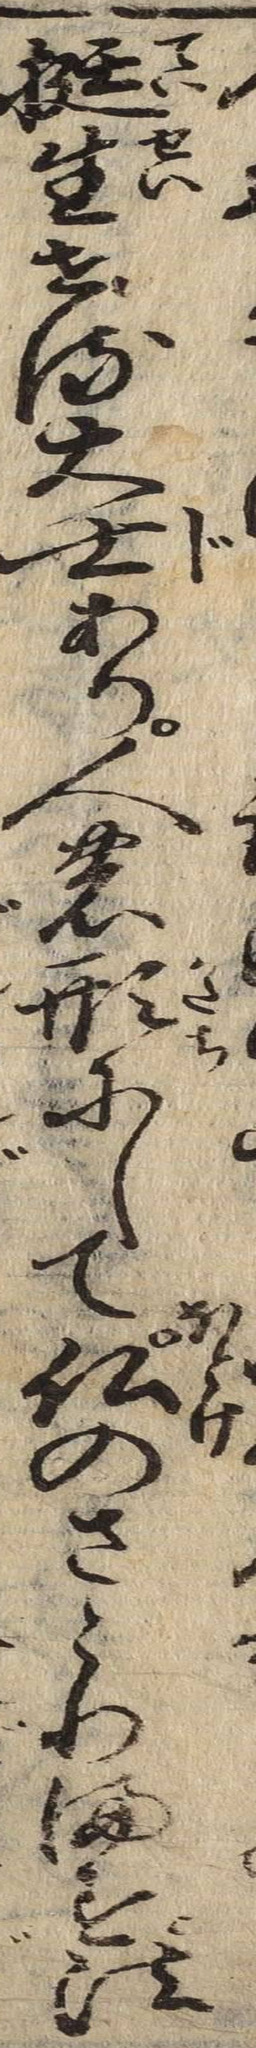挺生せる大士あり。人の形にして。仏のさとります。法
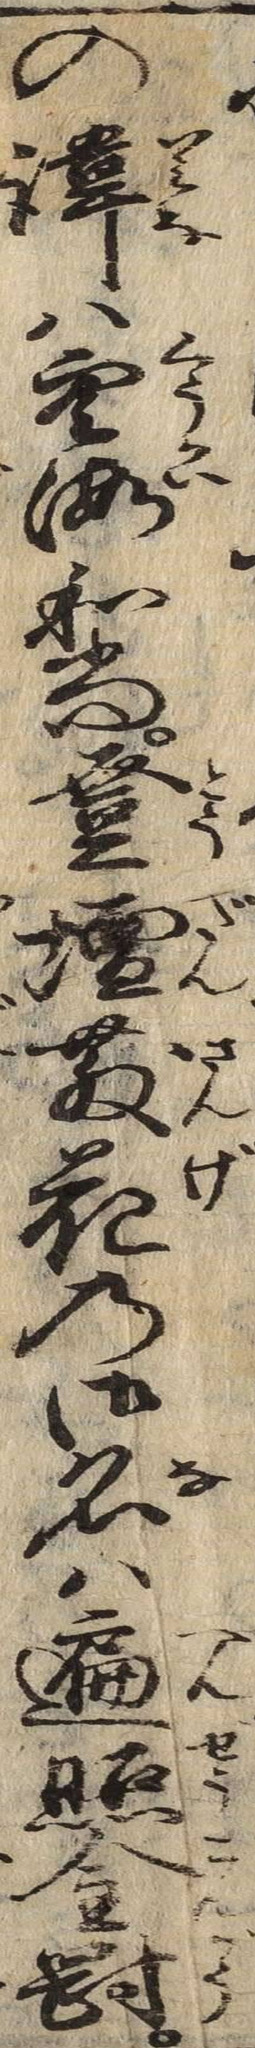の諱は空海和尚。登壇散花の御名は遍照金剛。
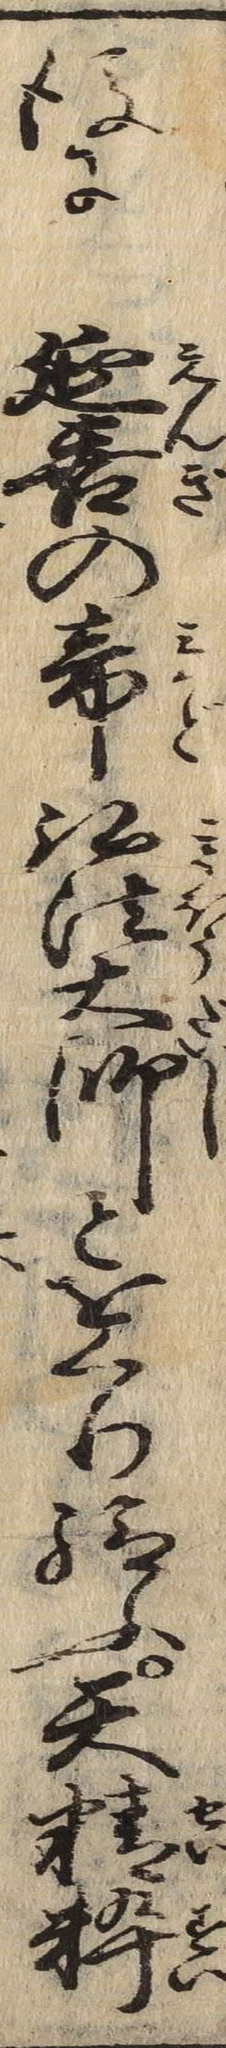後に延喜の帝弘法大師とをくり給ふ。天精粋
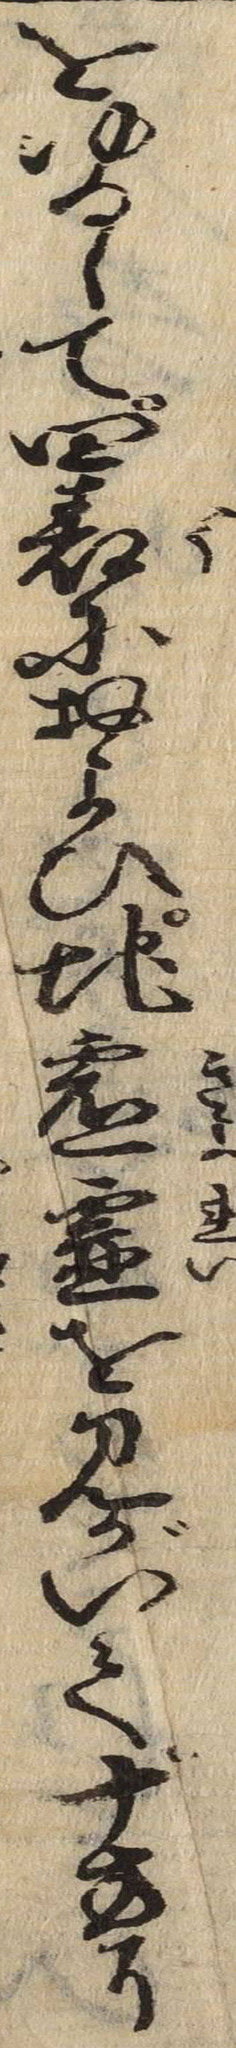をゆるして。四表におよひ。地虚霊をみがいて。十方に
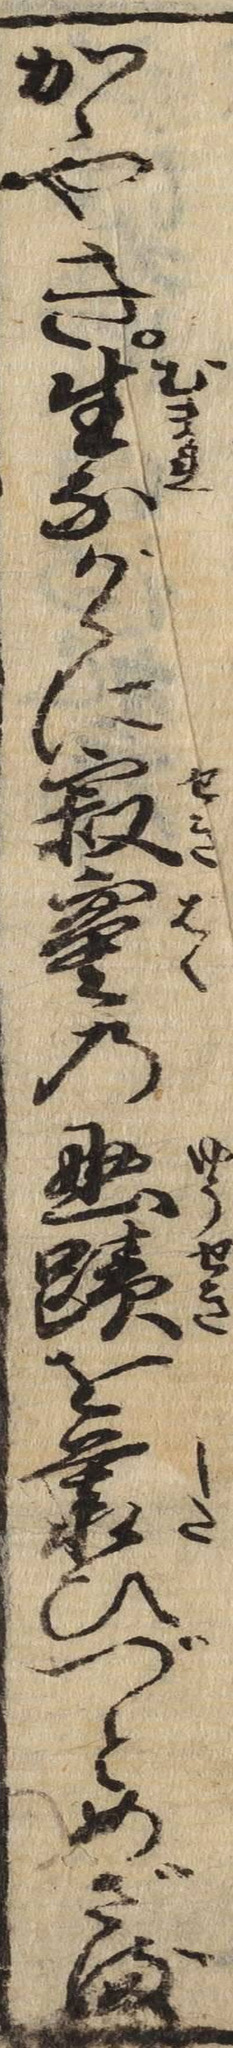かゝやき。生ながらに寂寞の幽蹟を慕ひ。つとめざる
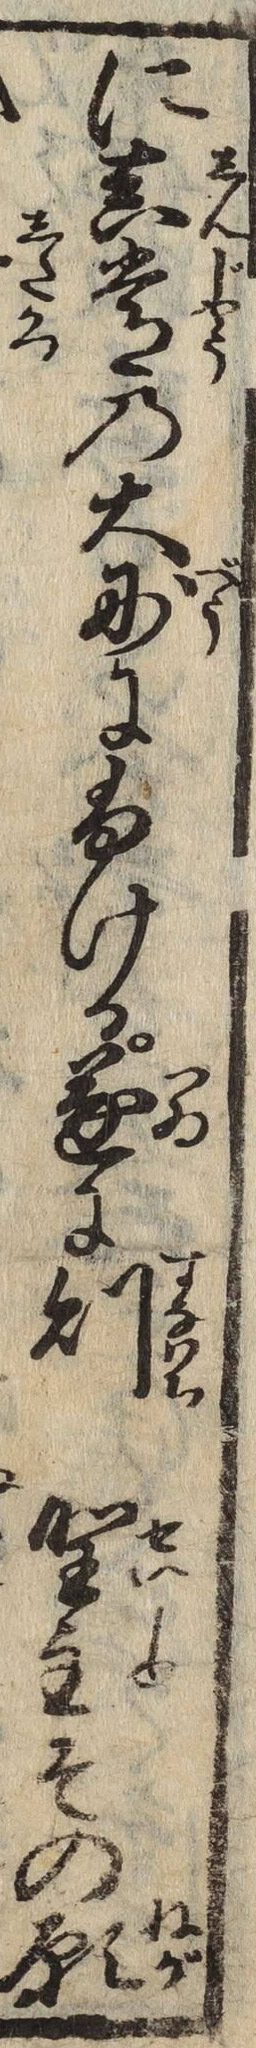に真常の大妙にふける。遂に則聖主その願
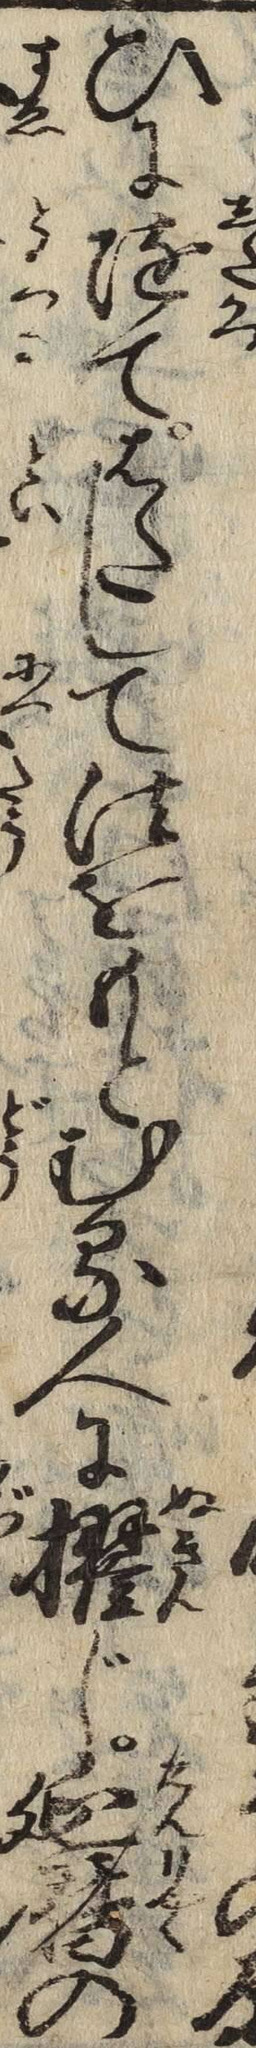ひに随て。はたして法をもとむる人に擢じ。延暦の
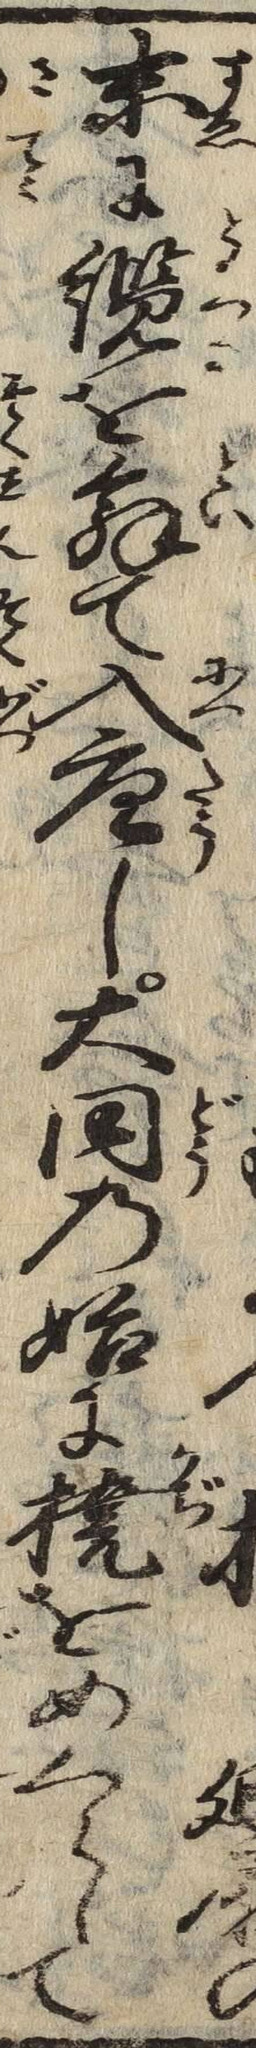末に纜を解て入唐し。大同の始に橈をめくらして
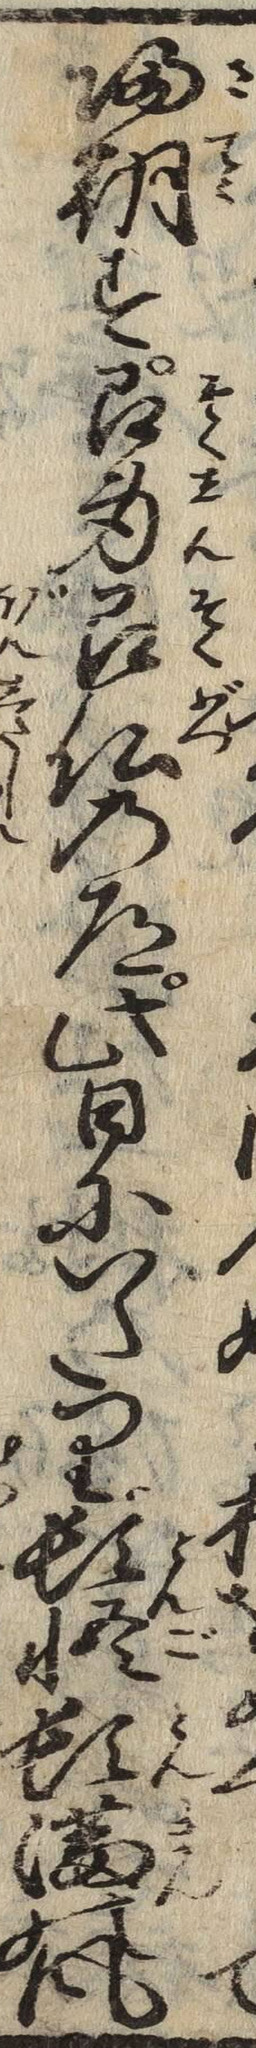帰朝す。即身即仏の道。此日にいたり。頓悟頓満の風
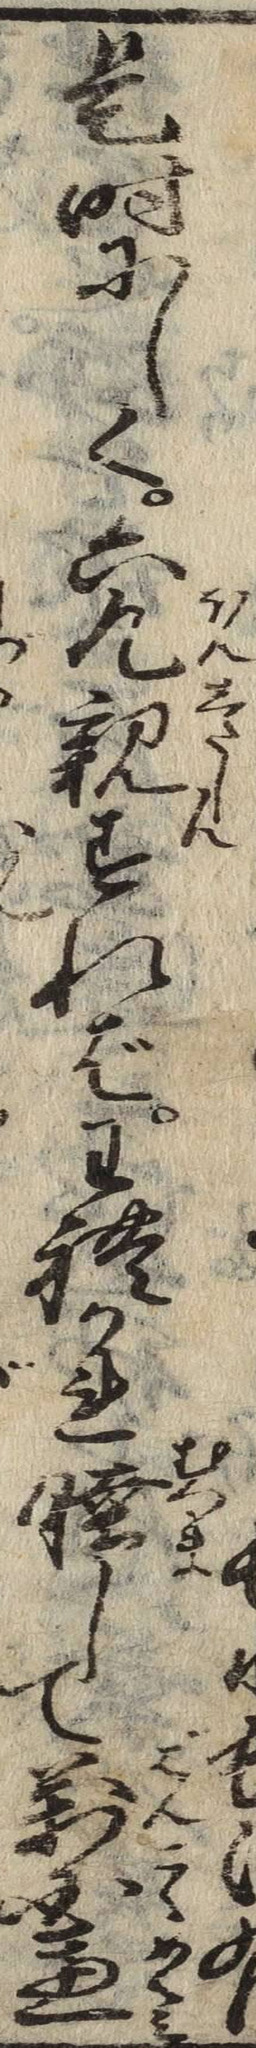是時にしく。六凡親すれば。われかれ睦して万国恵
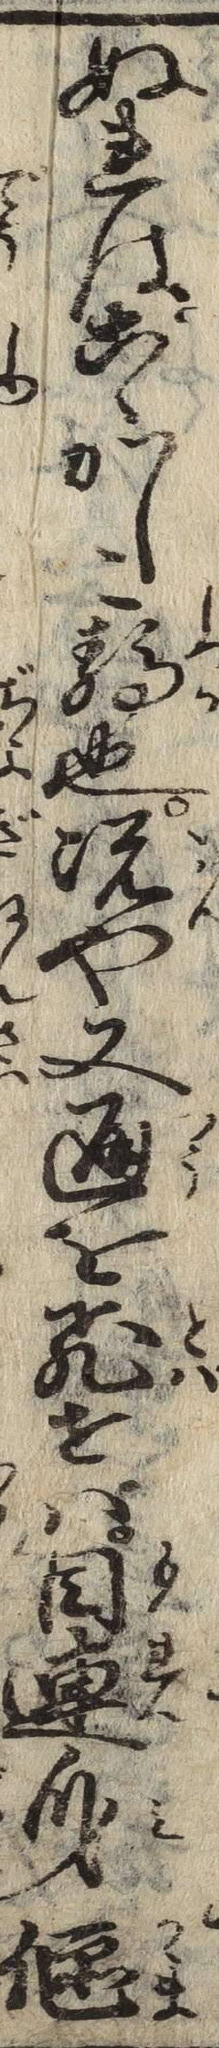ぬれは。こゝかしこ静也。況や又通を飛せば。目連身傴
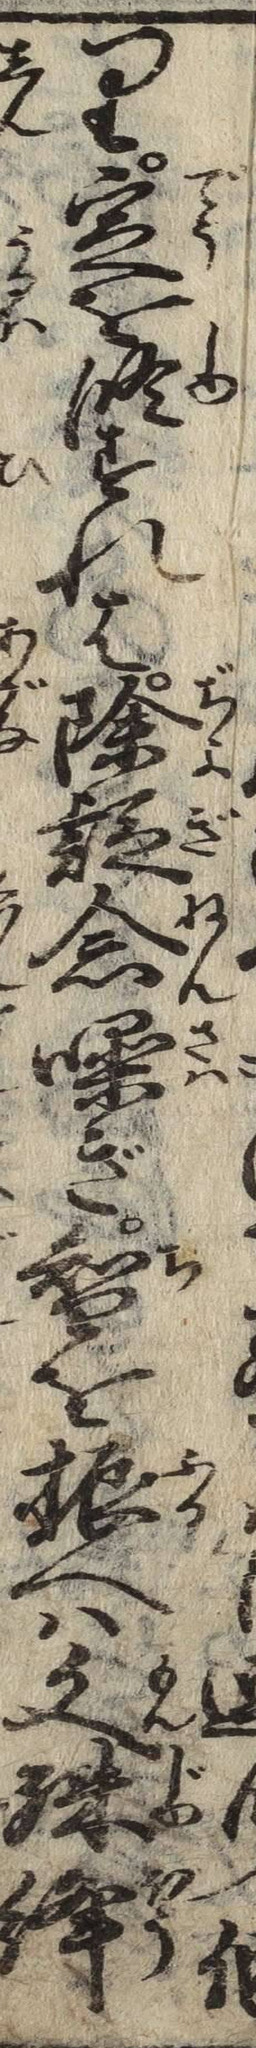り。定を修すれは。除疑念噪ぎ。智を振へは文殊絳
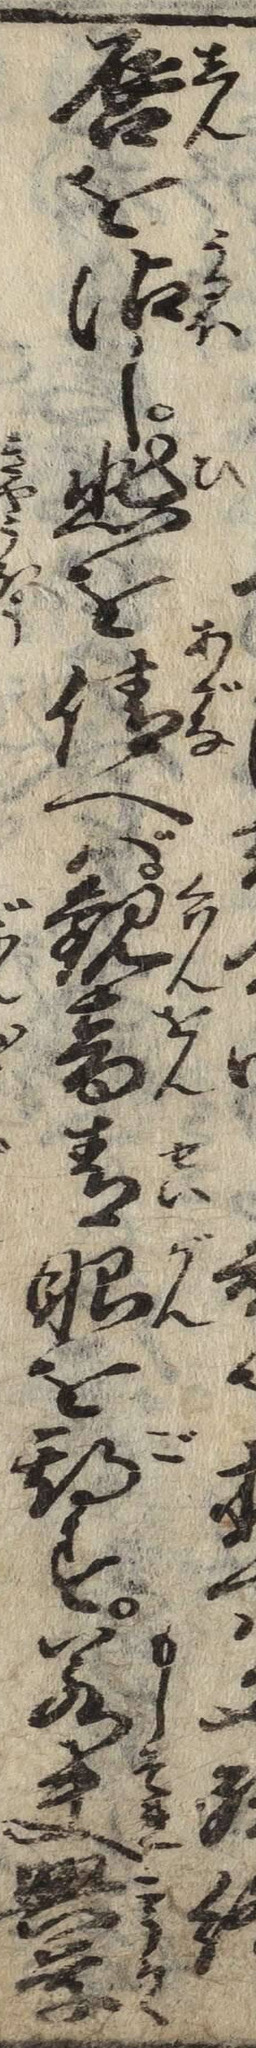唇を沾し。悲を債へば。観音青眼を期す。若夫興学
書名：弘法大師御傳記
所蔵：京都府立京都学・歴彩館 国文学研究資料館
